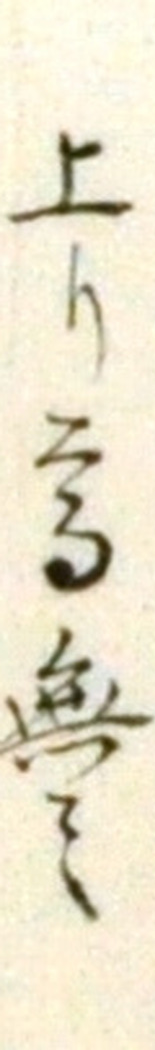上り高無之
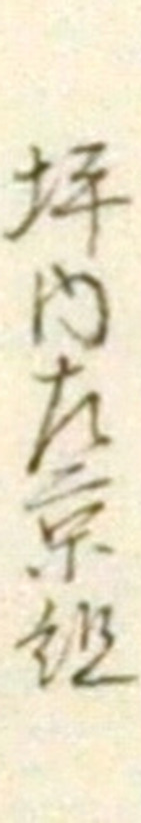坪内左京組
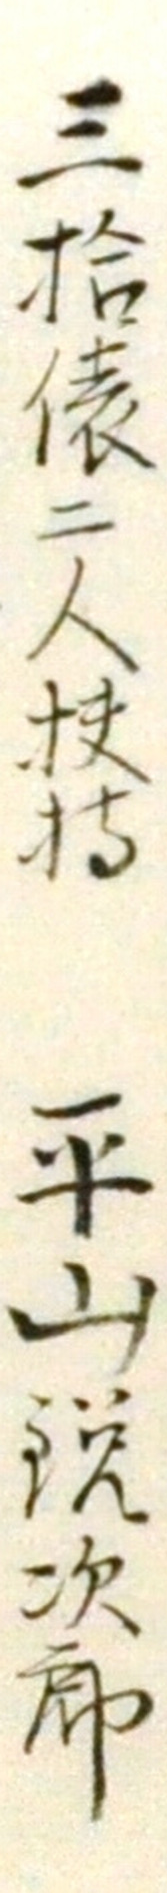三拾俵二人扶持平山鋭次郎
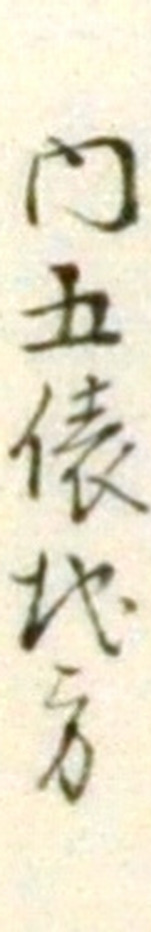内五俵地方
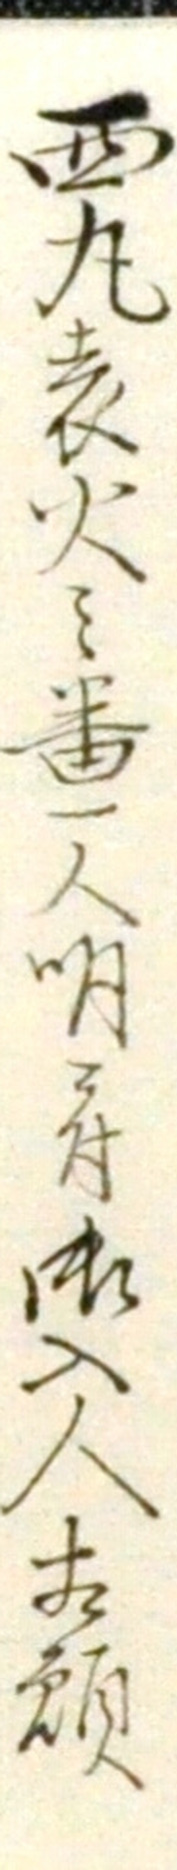西丸表火之番一人明ニ付御入人相願
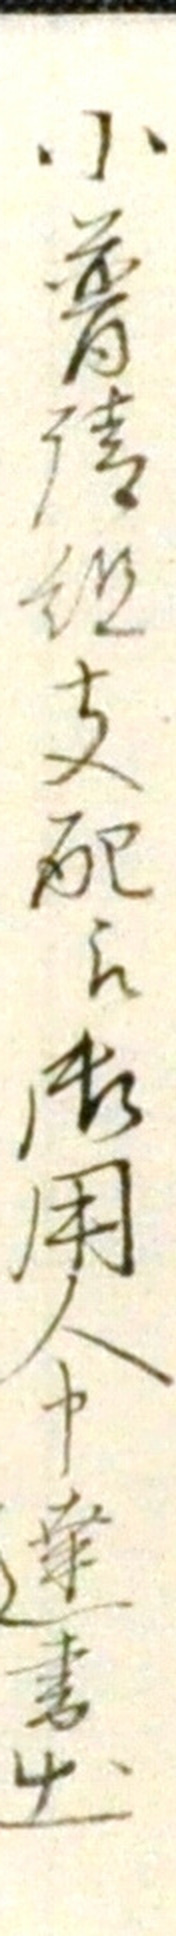小普請組支配江御用人申達書出
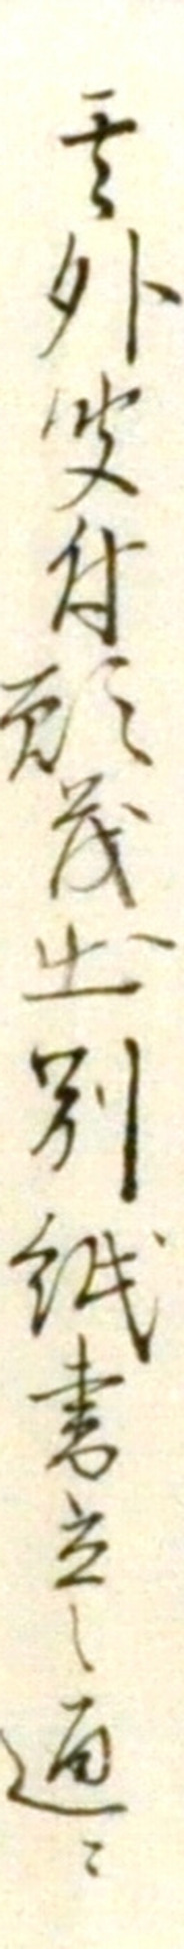其外聞付願も出別紙書立之通ニ
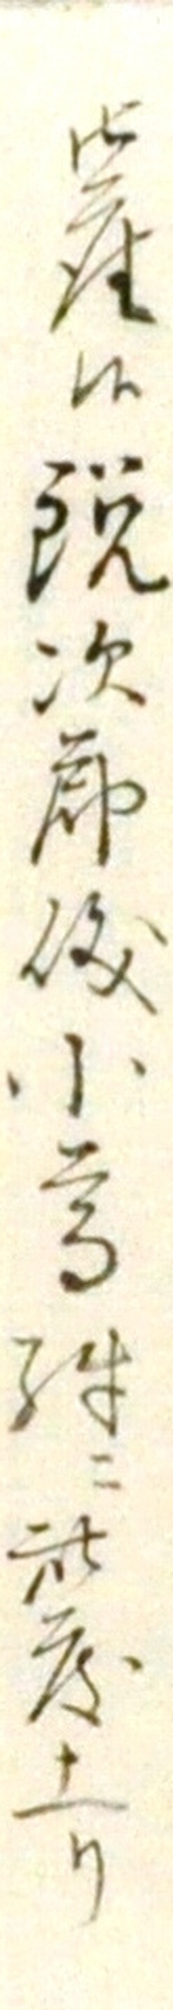御座候鋭次郎儀小高殊ニ此度上り
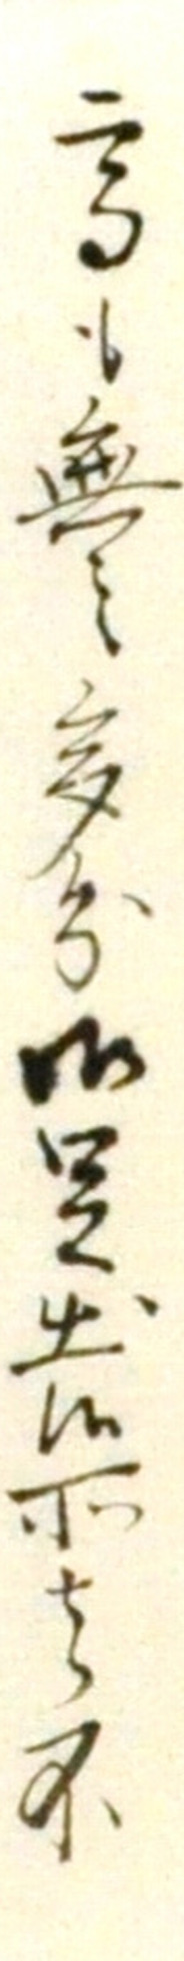高も無之多分御足出候所者不
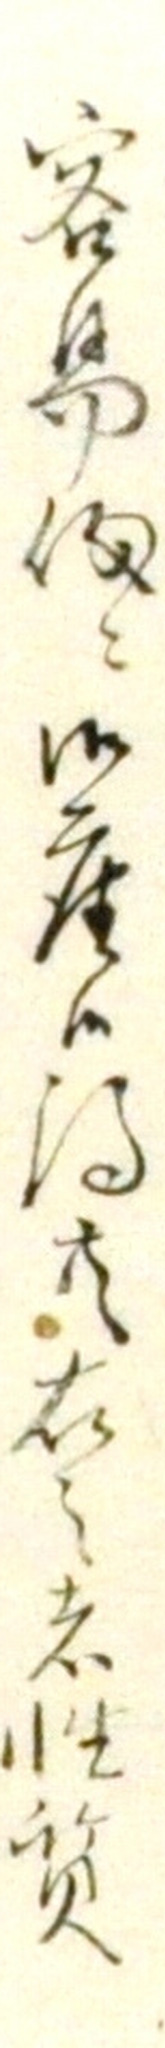容易儀ニ御座候得共右之者性質
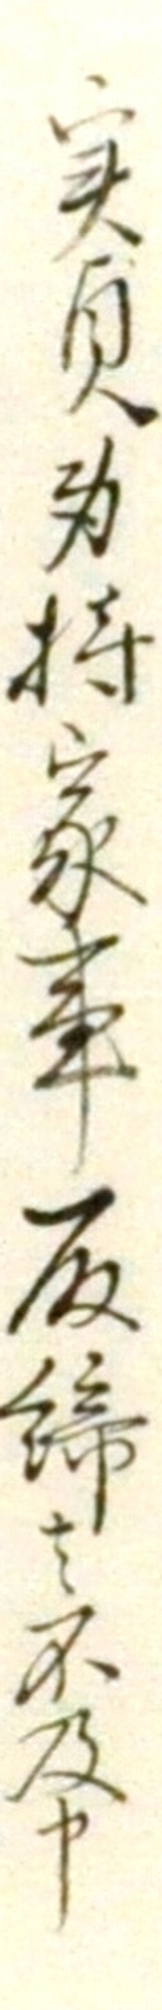実貞身持家事取締は不及申
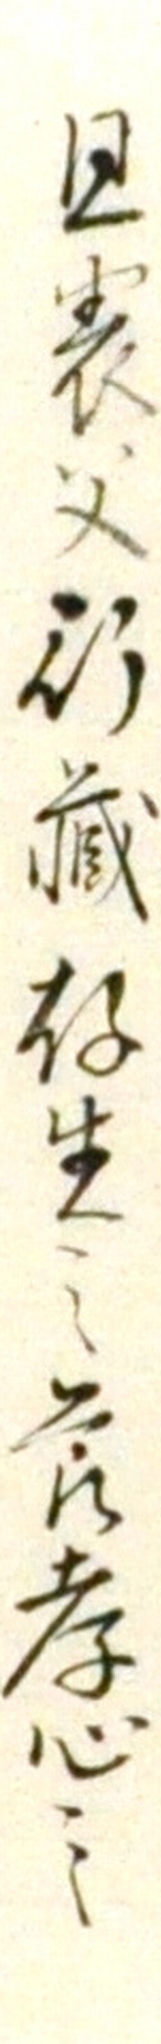且養父行蔵存生之節孝心之
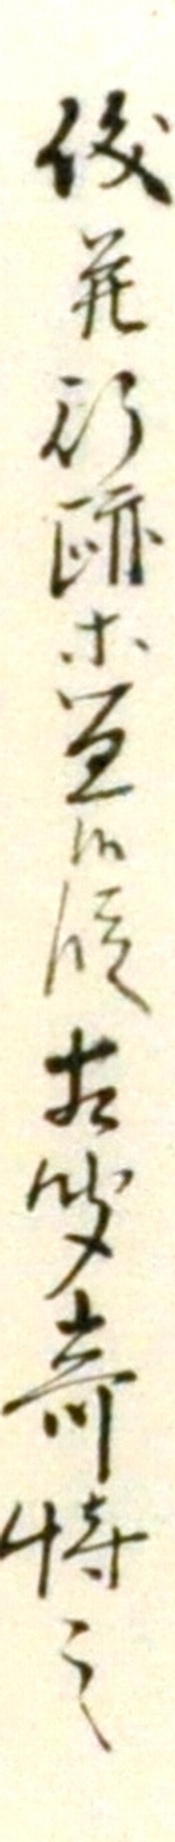儀并行跡等宜候段相聞奇特之
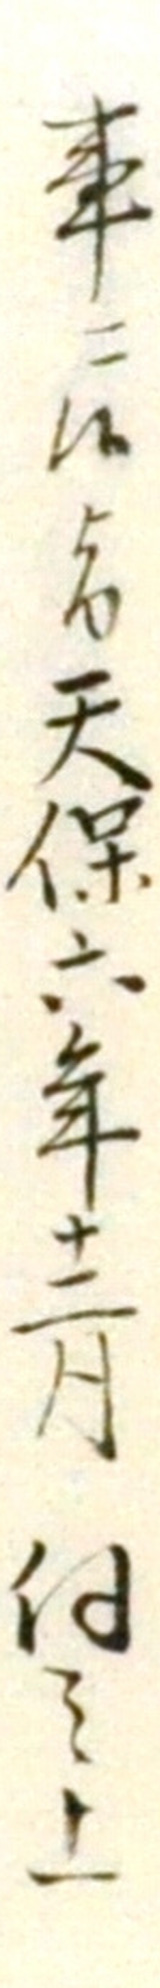事ニ候旨天保六年十二月伺之上
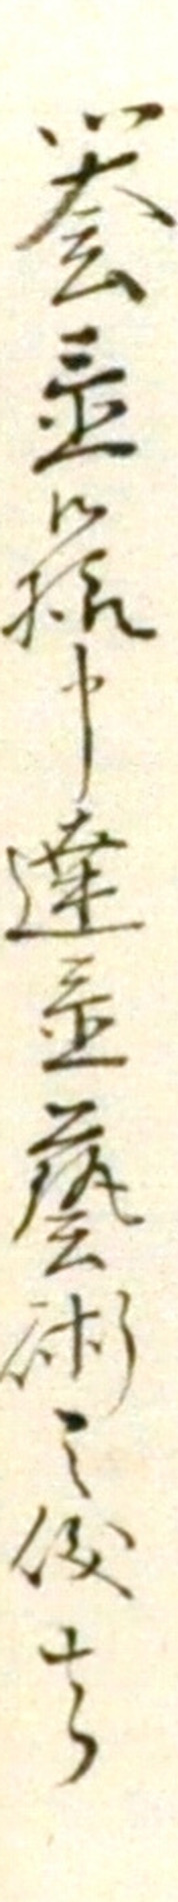誉置候様申達置芸術之儀者
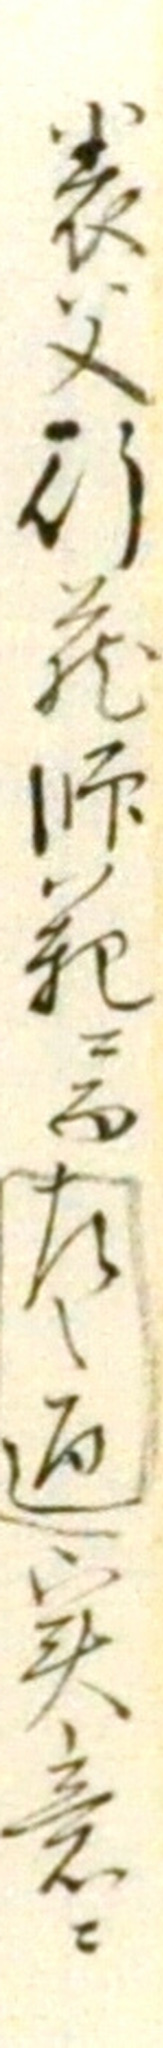養父行蔵師範ニ而左之通実意ニ
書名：下案・西丸火之番調
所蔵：伊那市立高遠町図書館・合同会社AMANE
